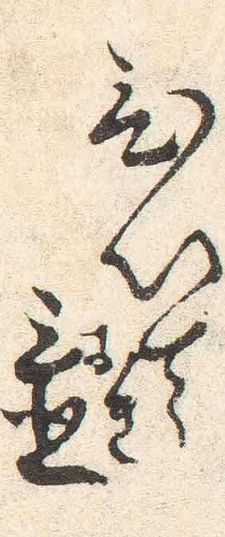ひいて
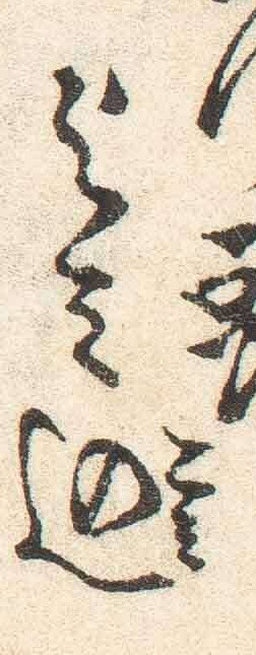よみ込
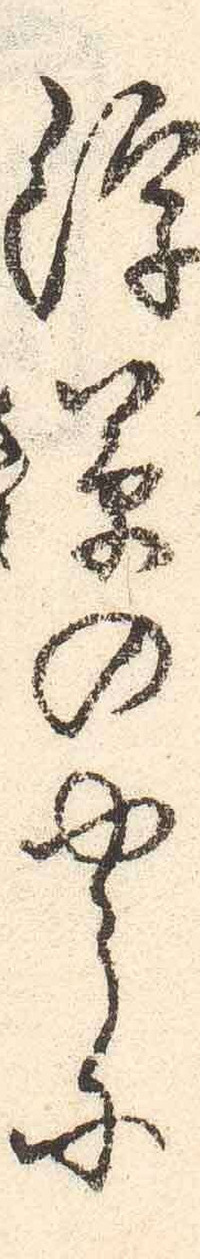浮草のやうに
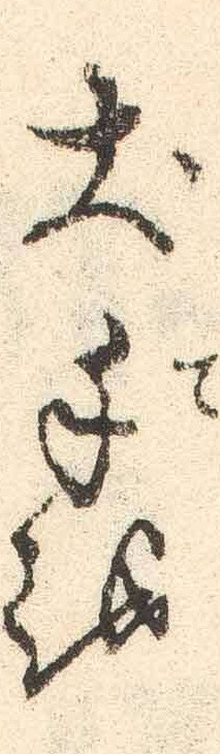土手を
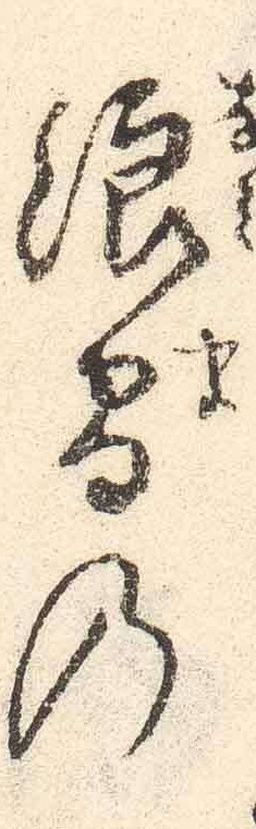浪間の
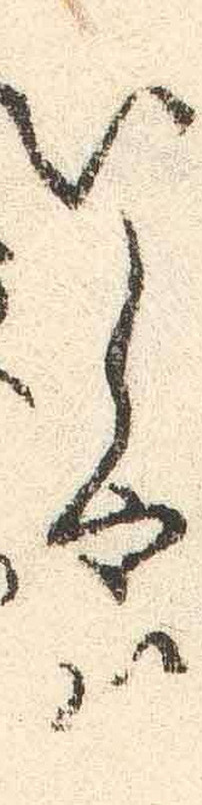いしやは
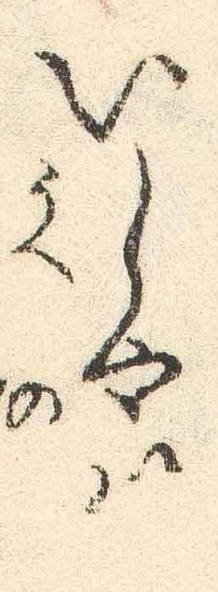いしやは
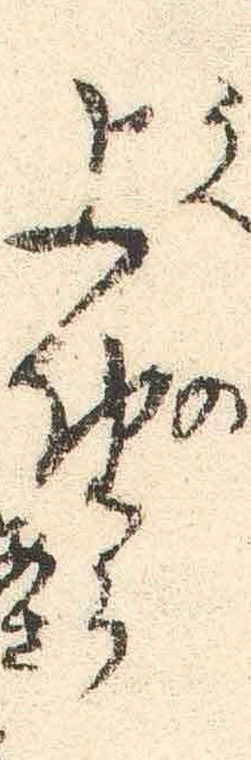上野か
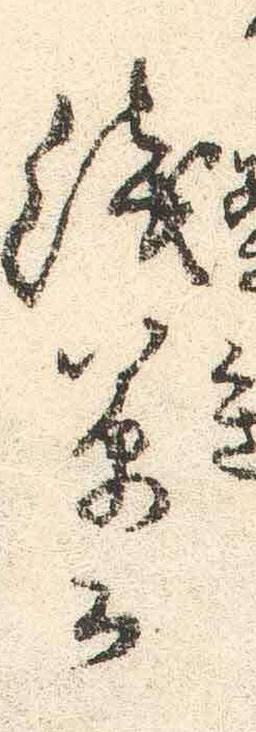浅草か
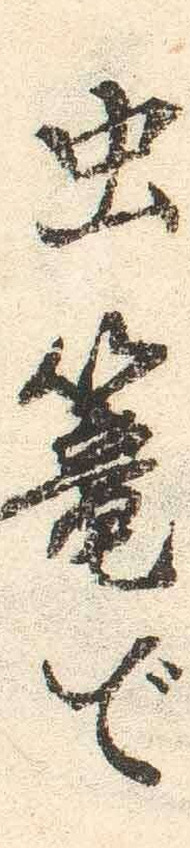虫篭で
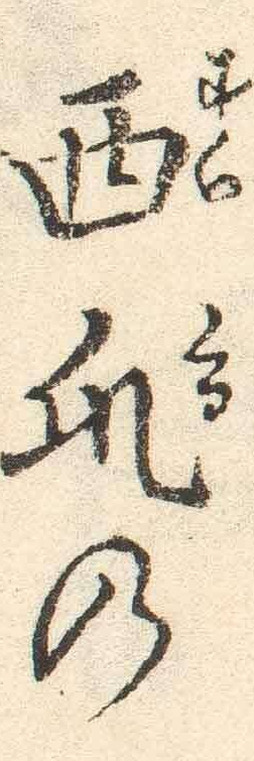西瓜の

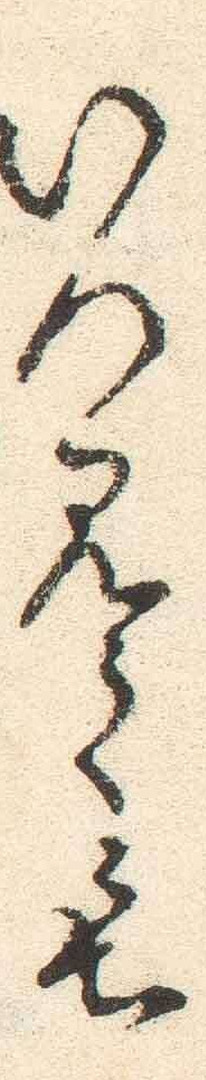いつ見ても
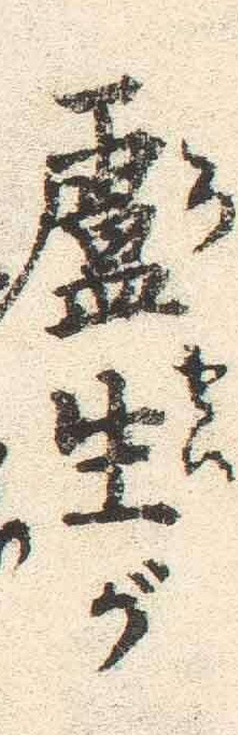盧生が
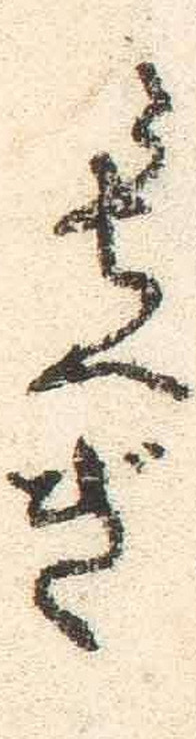もへぎ
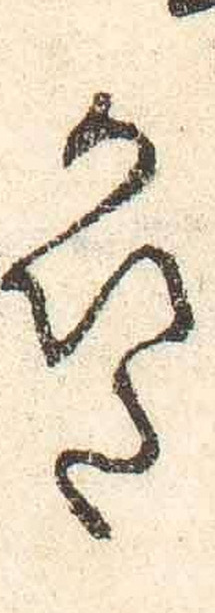かいた
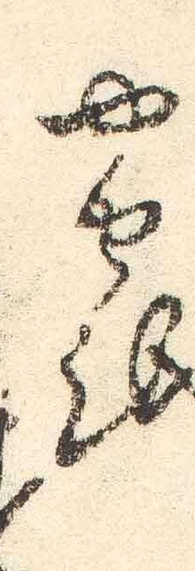やせを
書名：画本柳樽
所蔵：東京学芸大学附属図書館 国文学研究資料館
